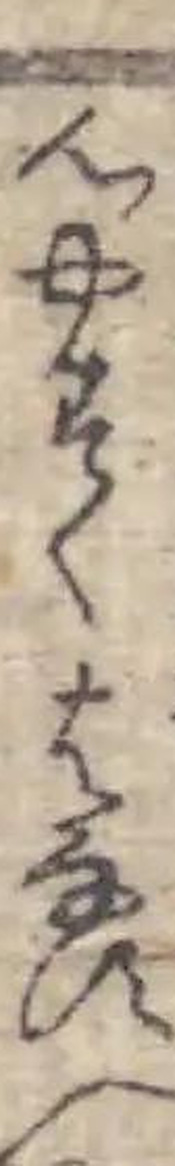心やすくはなす
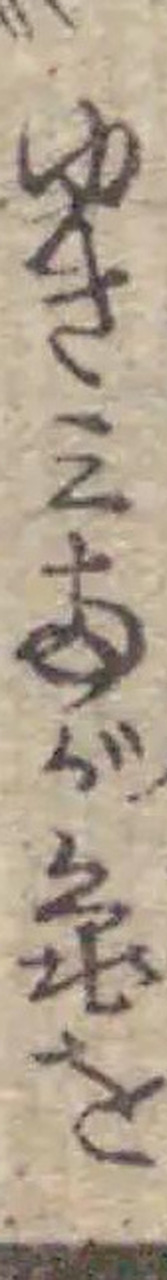ゆき三両が亀を
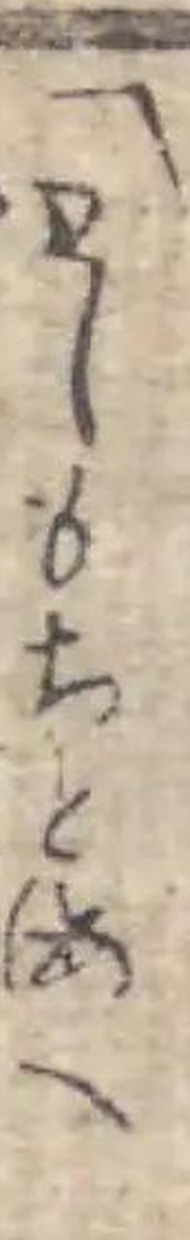〽わしもちと海へ
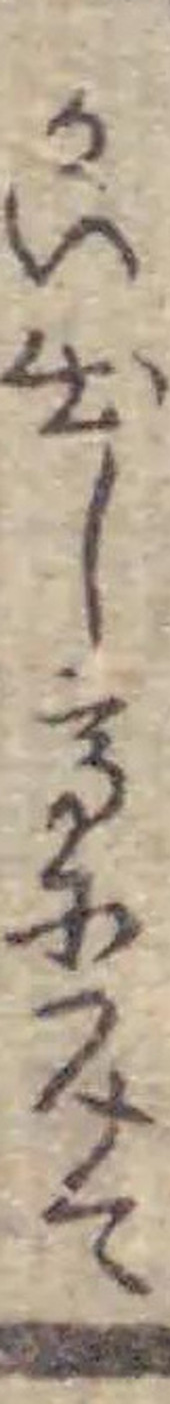かい出し馬につけて
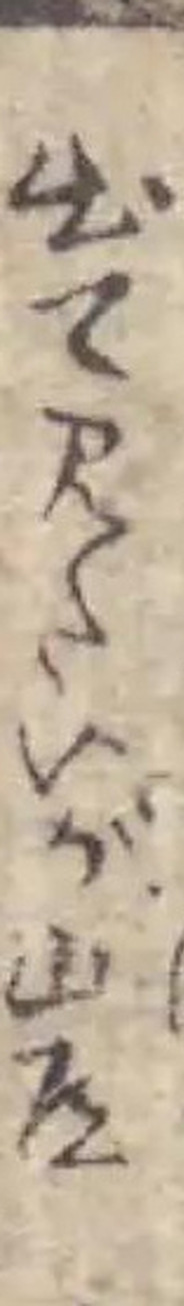出てみたいが山道
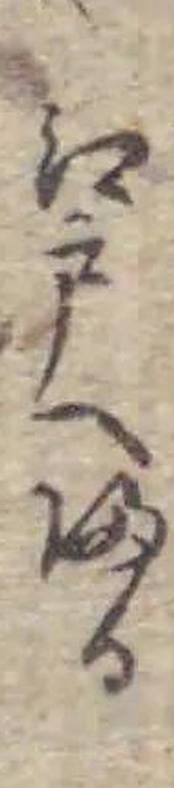江戸へ帰る
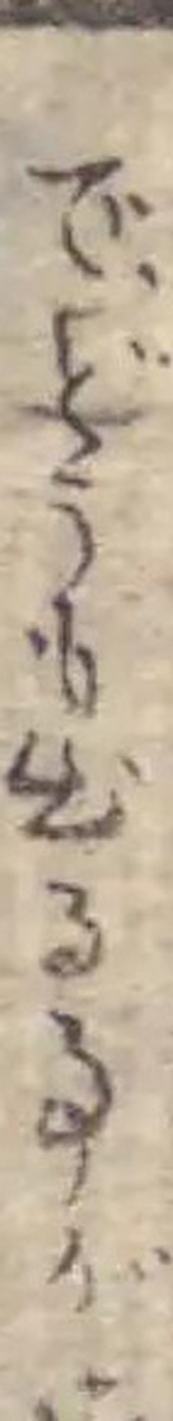でどうも出る事が
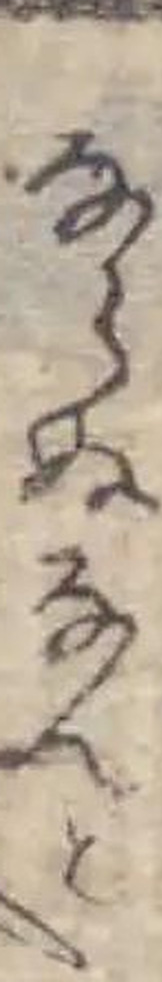ならぬなんと
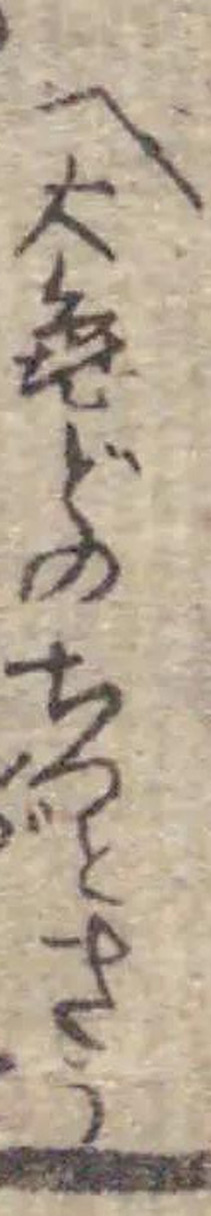〽大亀どのちつときう
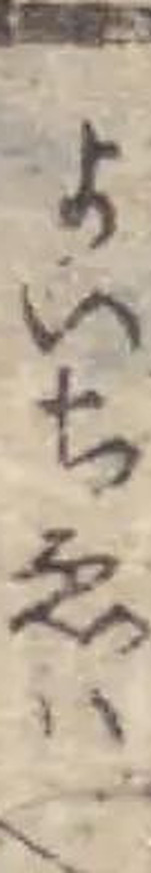よいちゑは
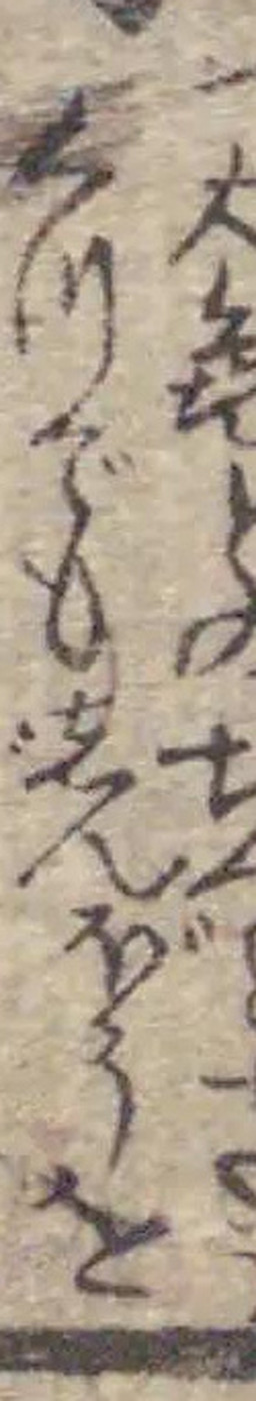くつでもしんぼうを
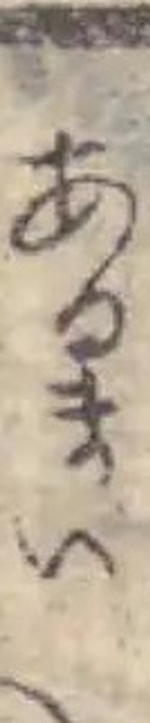あるまい
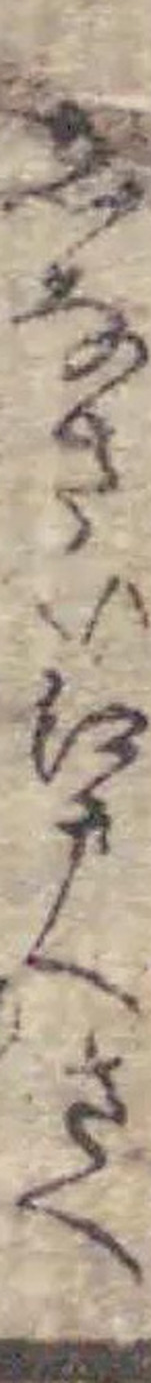しなさい江戸へさへ
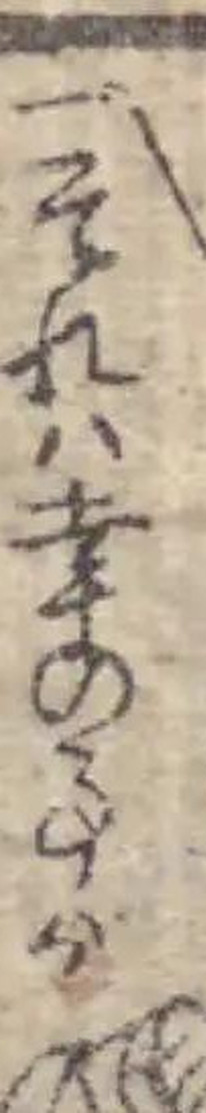〽それは幸の事が
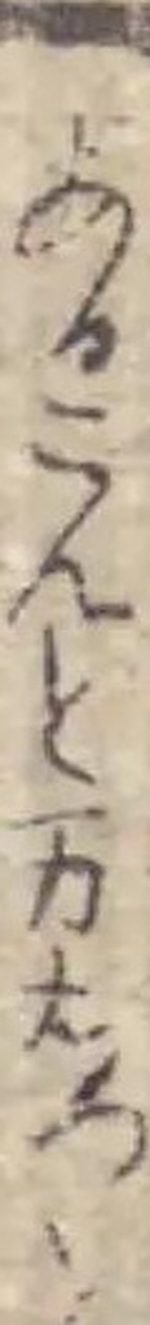あるこんと万右衛門と
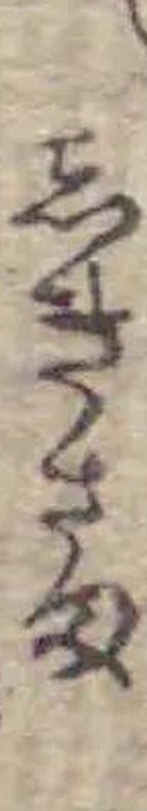しきさま
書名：見立蓬莱 : 2巻
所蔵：国立国会図書館 National Diet Library, JAPAN
